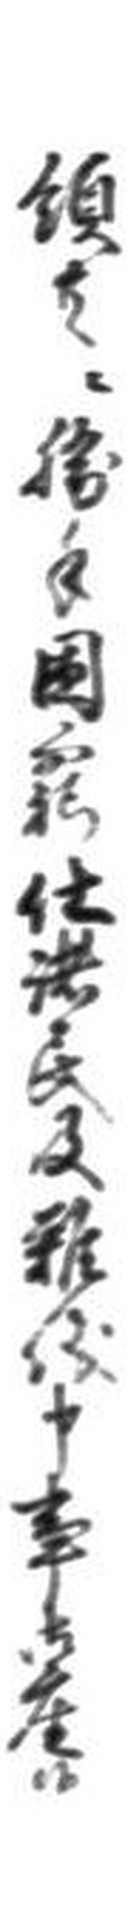領共ニ勝手困窮仕諸民及難儀申事御座候
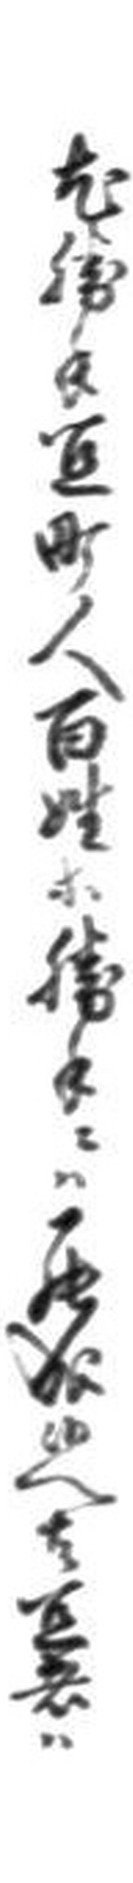尤勝手宜町人百姓等勝手ニハ罷成候へ共宜者ハ
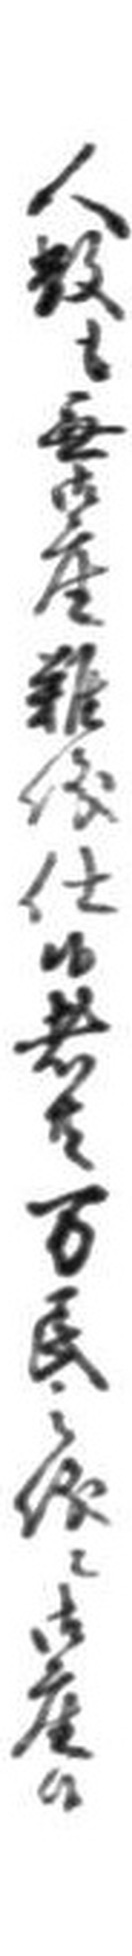人数も無御座難儀仕候者共万民之儀ニ御座候
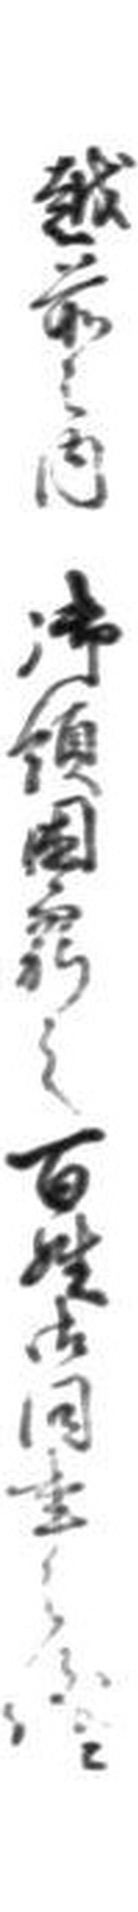越前之内御領困窮之百姓御同事之儀ニ

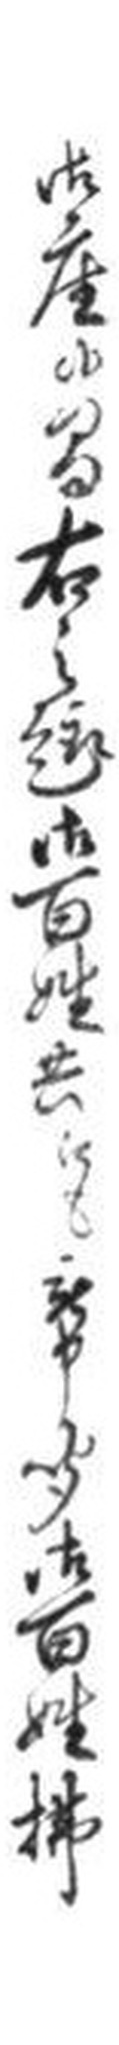御座候間右之趣御百姓共江も被申聞御百姓払
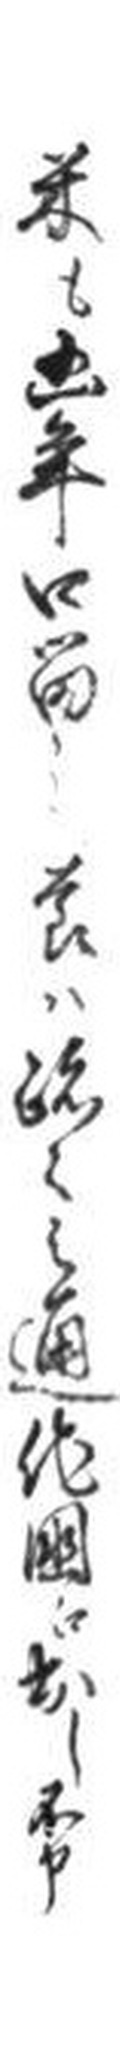米も凶年口留之節ハ跡々之通他国江出し不申
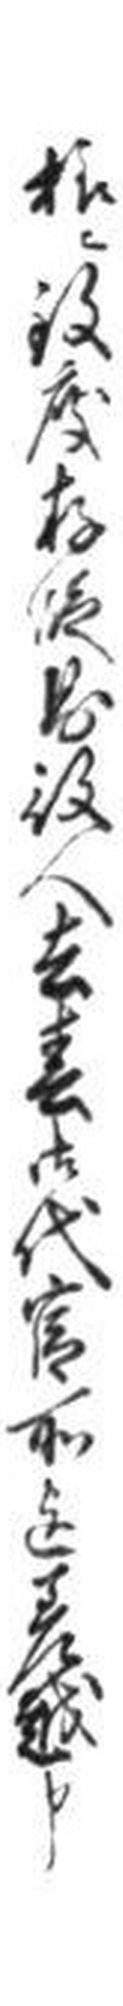様ニ致度存段則役人去春御代官所迄差越申
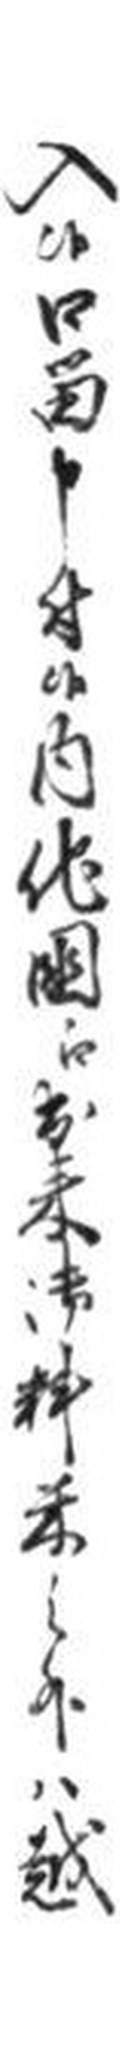入候口留申付候内他国江出来御料米之外ハ越
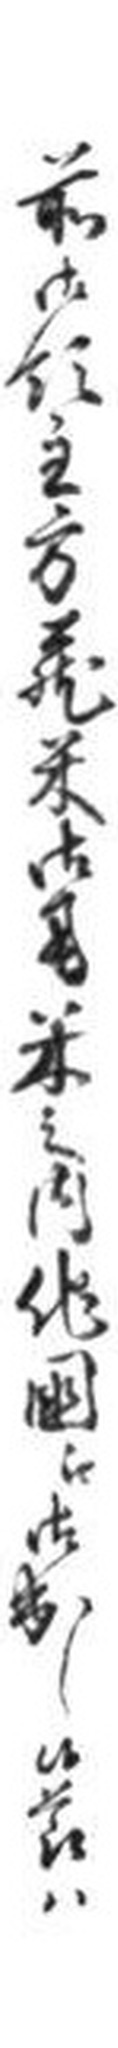前御領主方蔵米御用米之内他国江御出し候節ハ
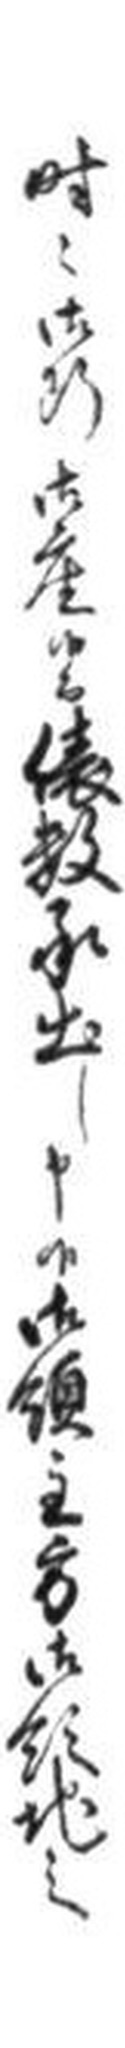時々御断御座候而俵数承出し申候御領主方御領地之
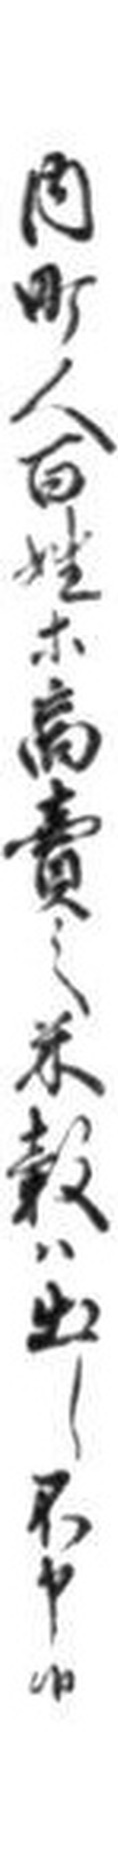内町人百姓等商売之米穀ハ出し不申候
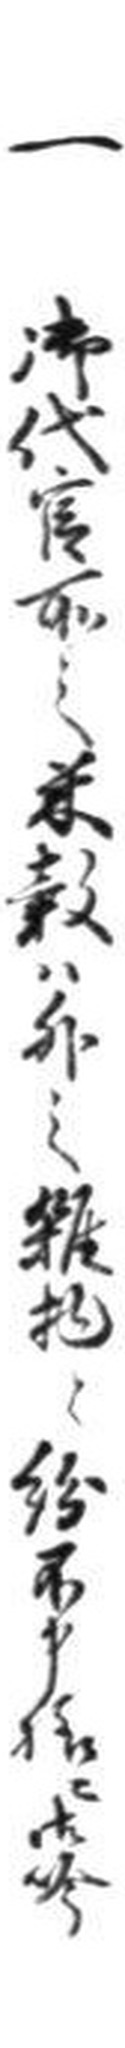一御代官所之米穀ハ外之雑穀と紛不申様ニ御吟
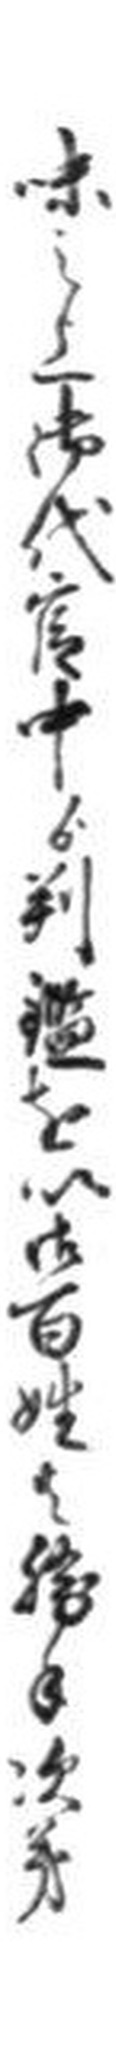味之上御代官中ゟ判鑑を以御百姓共勝手次第
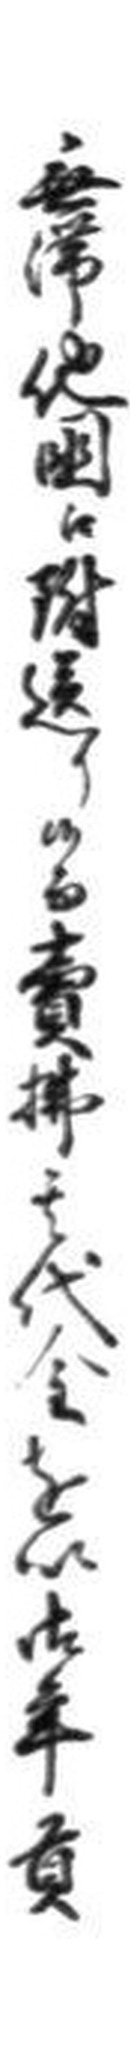無滞他国江付送り候而売払其代金を以御年貢
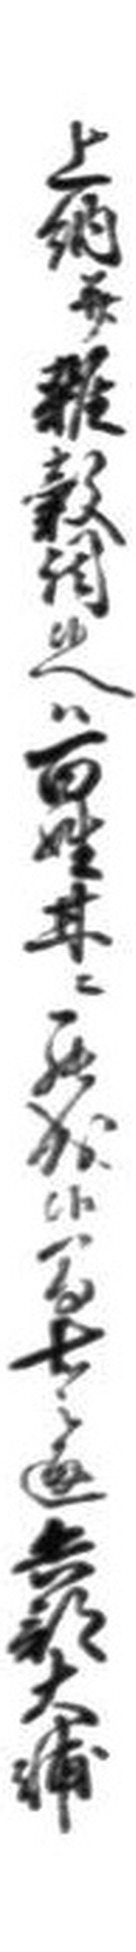上納并雑穀調候ヘハ百姓甘ニ罷成候間右之通兵部大輔
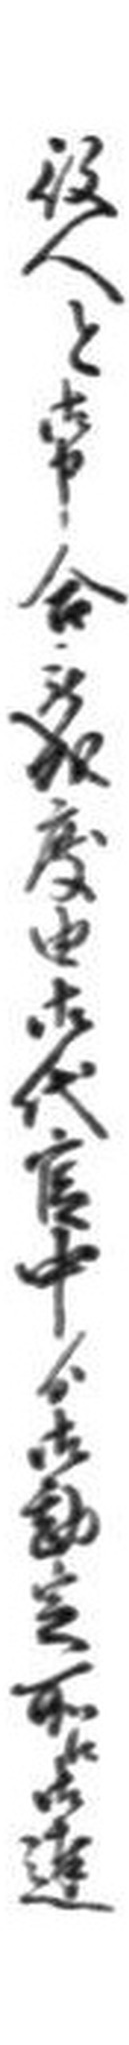役人と御申合被成度由御代官中ゟ御勘定所江御達
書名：家譜 二十二 吉品公 従元禄十五年到同十六年
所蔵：福井県文書館 Fukui Prefectural Archives
